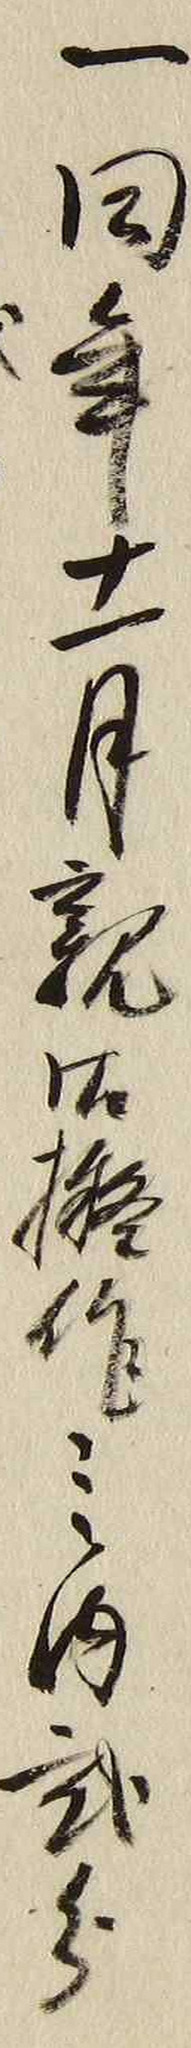一同年十一月親御擬作之内弐分
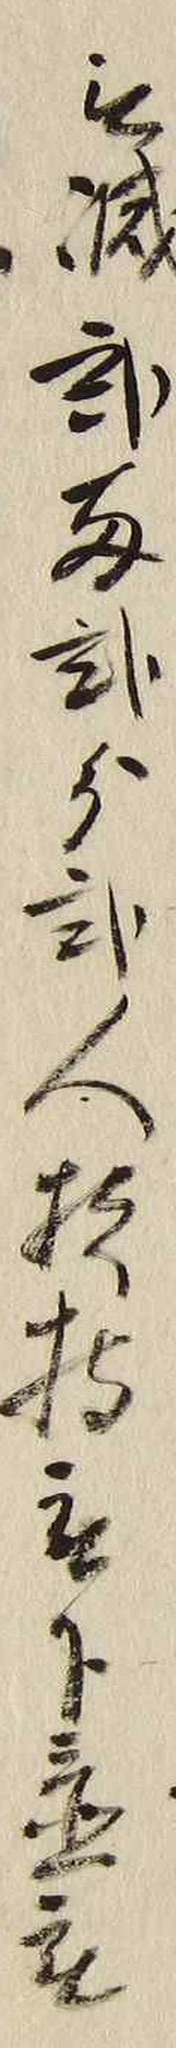被減弐両弐分弐人扶持被下置被
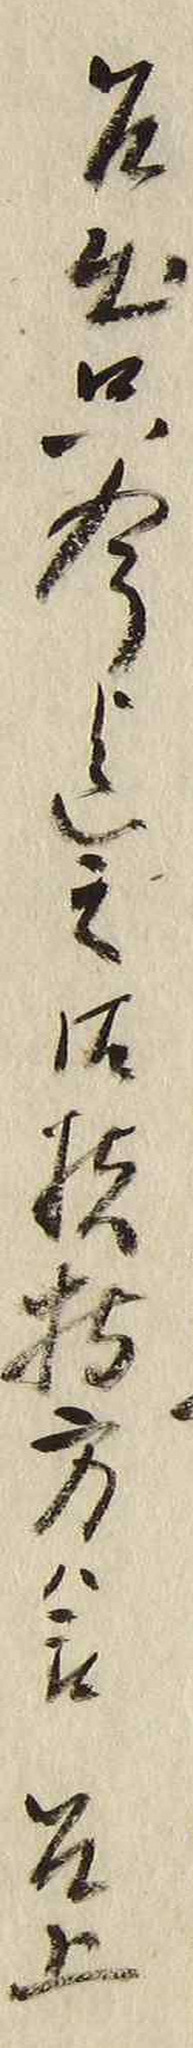召出只今迄之御扶持方被召上

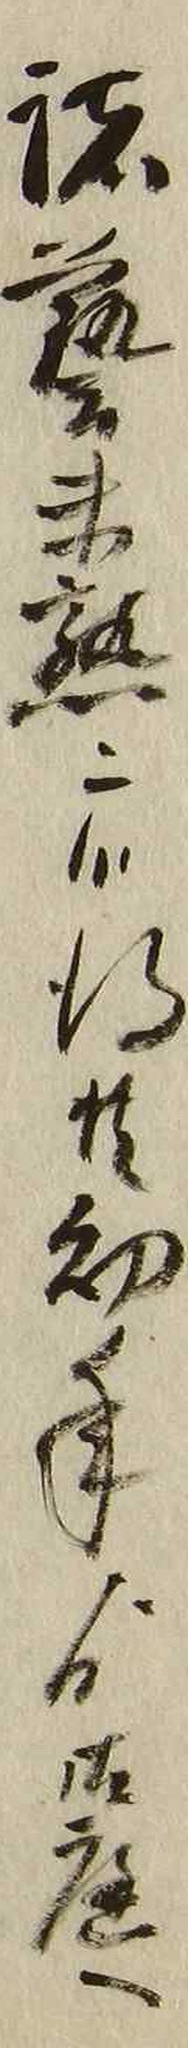諸芸未熟ニ候得共幼年ゟ御庭へ
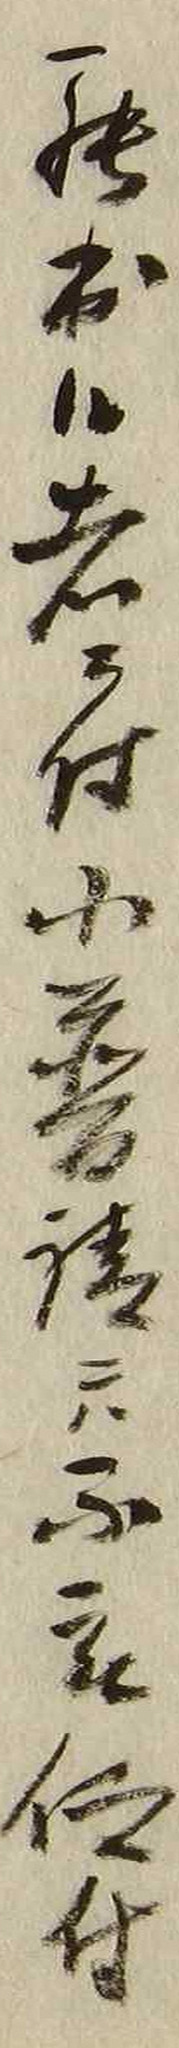罷出候者ニ付小普請ニハ不被仰付
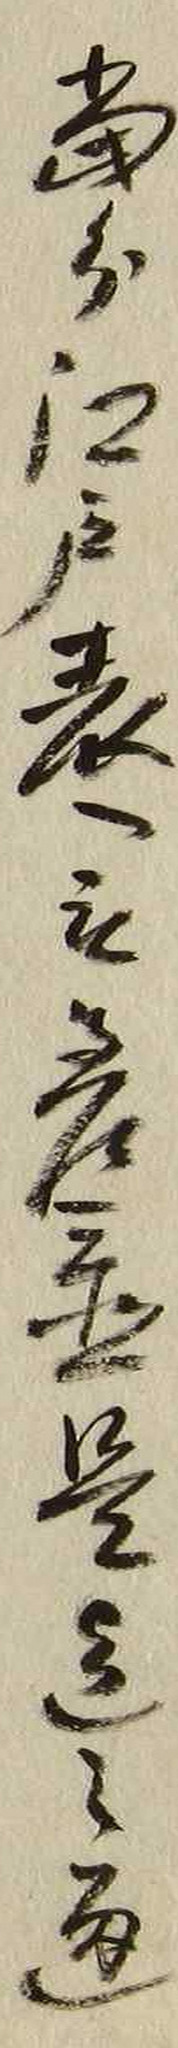当分江戸表へ被差置是迄々通
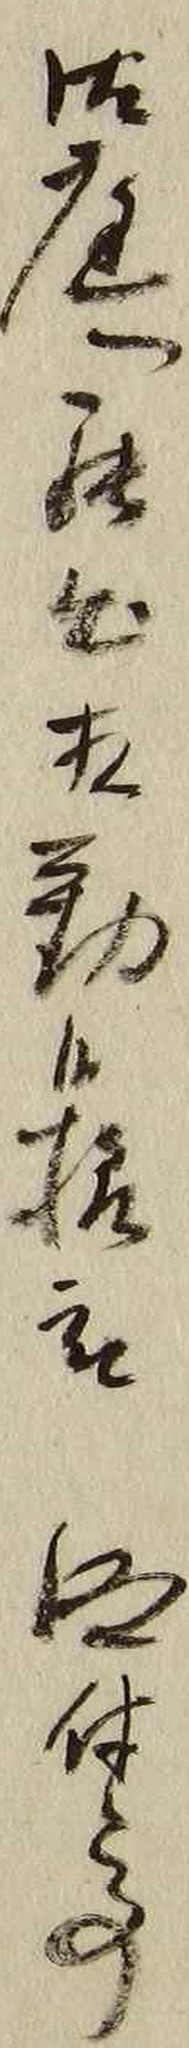御庭へ罷出相勤候様被仰付候事
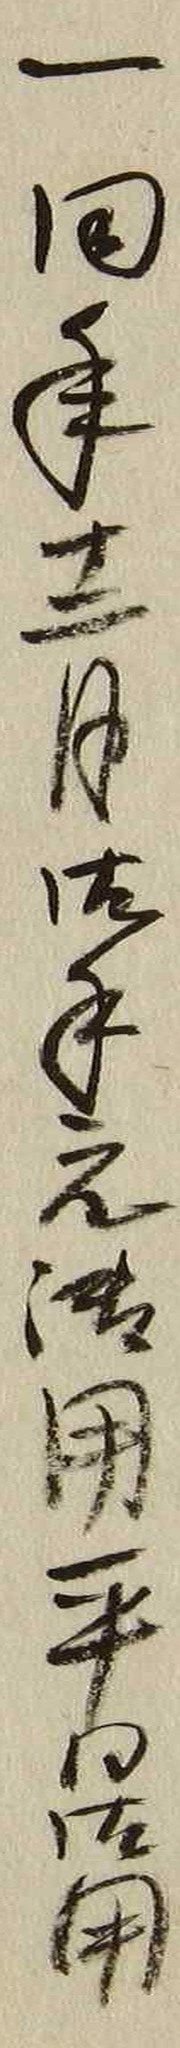一同年十二月御手元御用平日御用
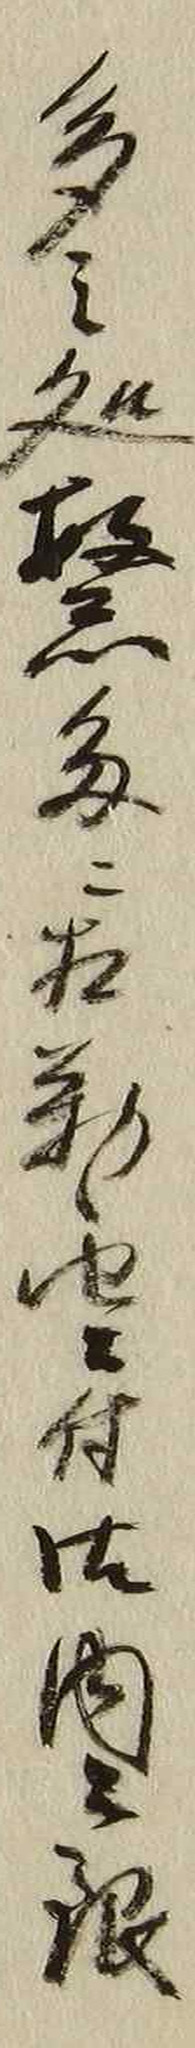多之処繁多ニ相勤候由ニ付御内々銀
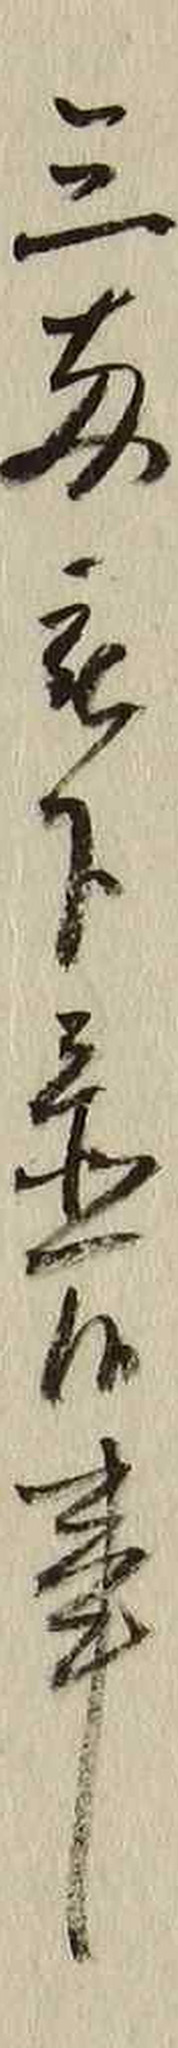三両被下置候事
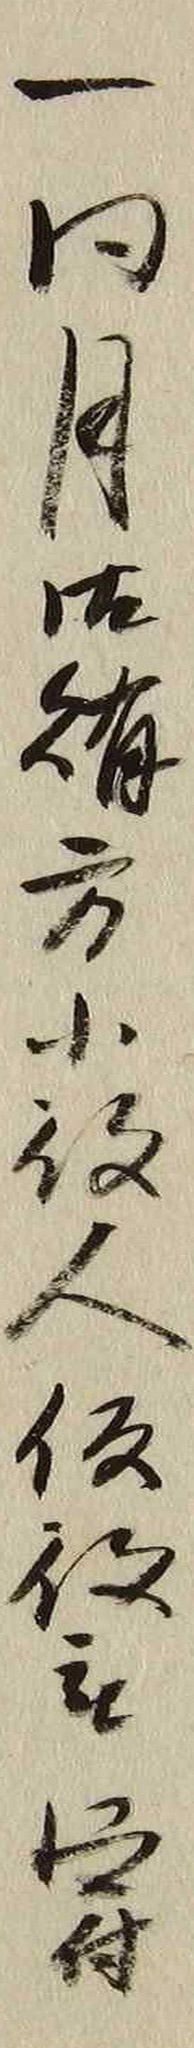一同月御賄方小役人仮役被仰付
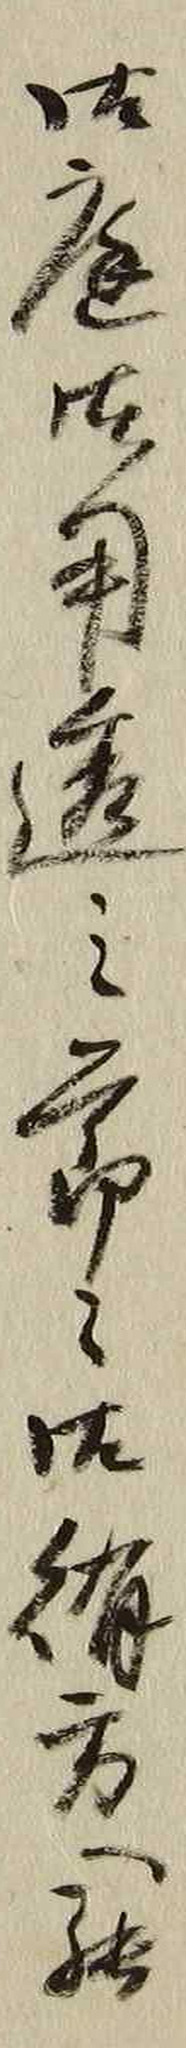御庭御用透之節々御賄方へ罷
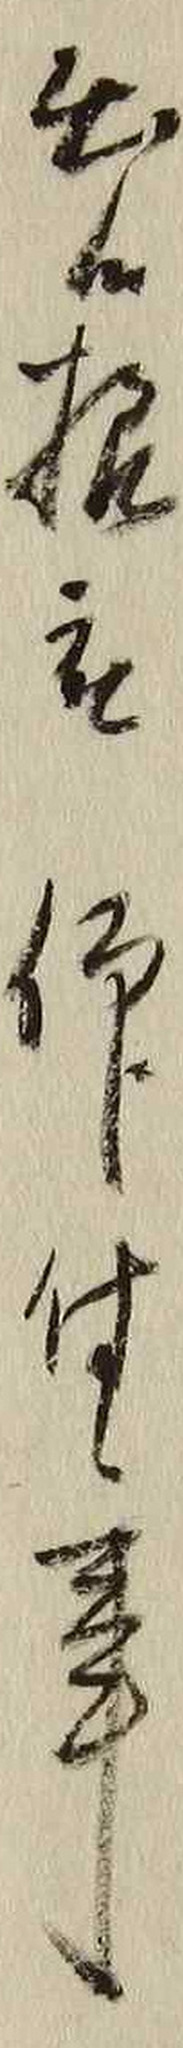出候様被仰付候事
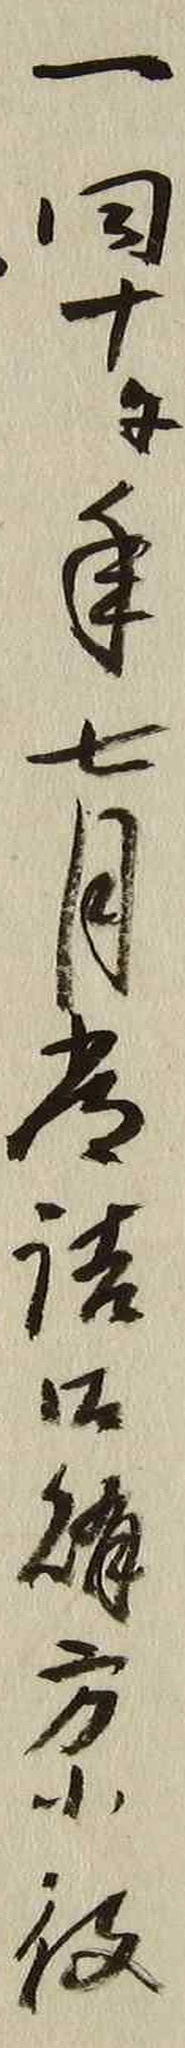一同十午年七月常詰御賄方小役
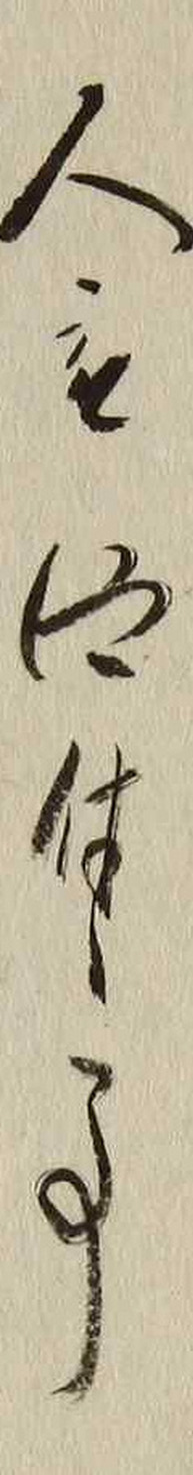人被仰付候事
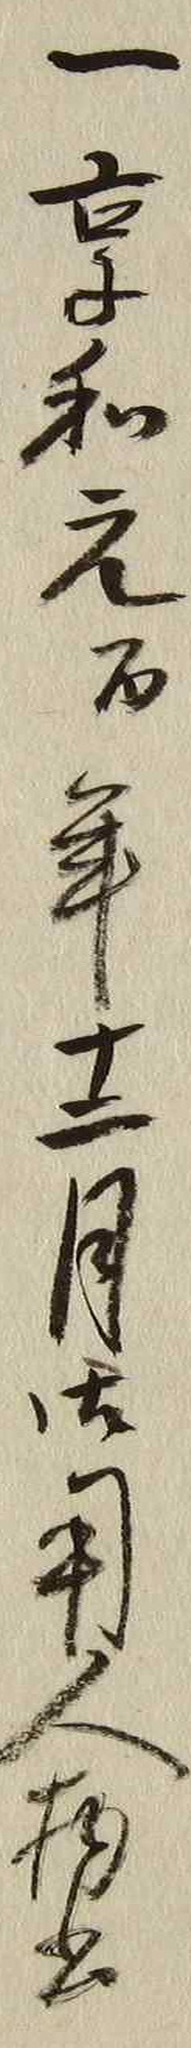一享和元酉年十二月御用人物書
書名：諸士系譜　巻之353　す之部3
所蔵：会津若松市立会津図書館
